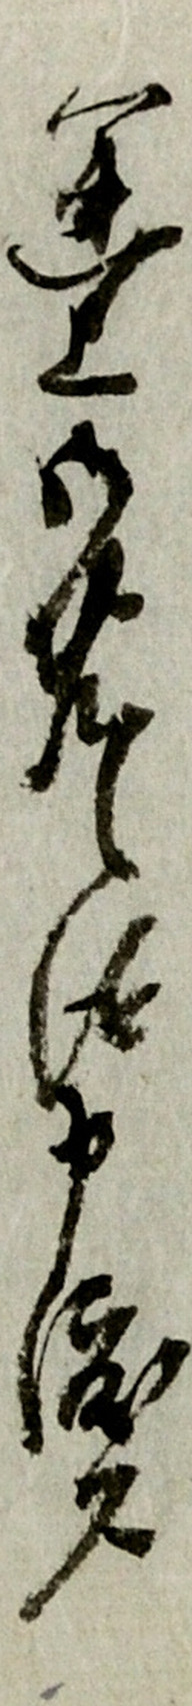運上御免候様申渡ス
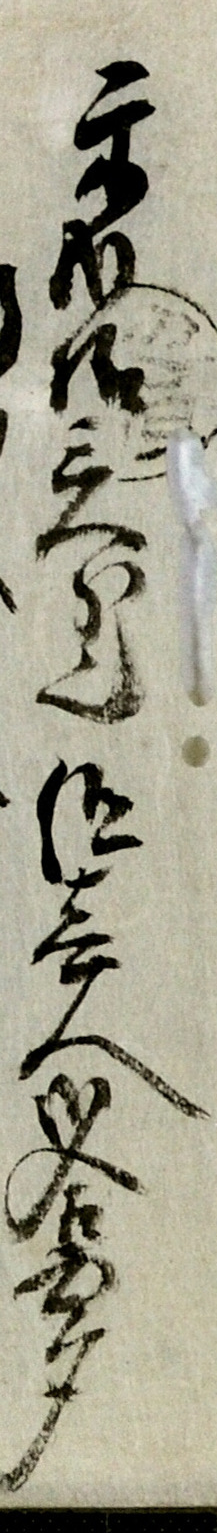米弐拾三人分也但壱人弐合五勺
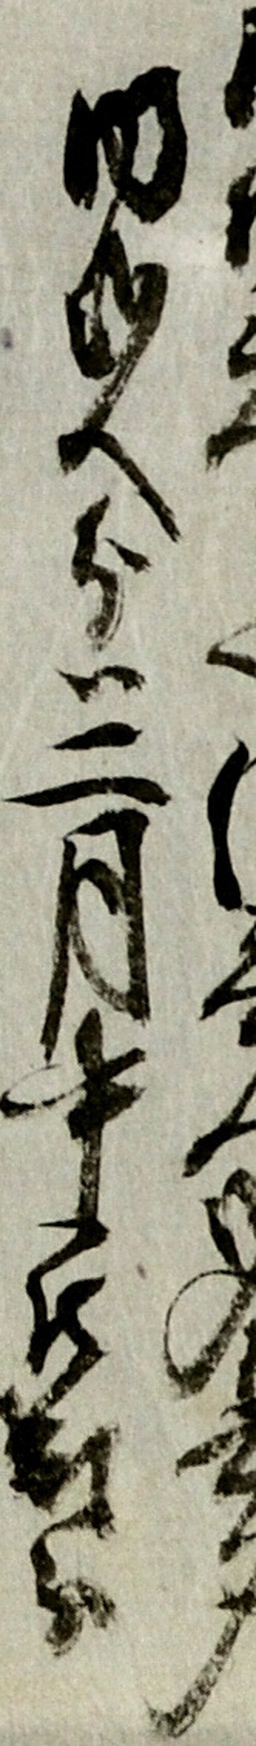内弐人分ハ二月中罷出候分
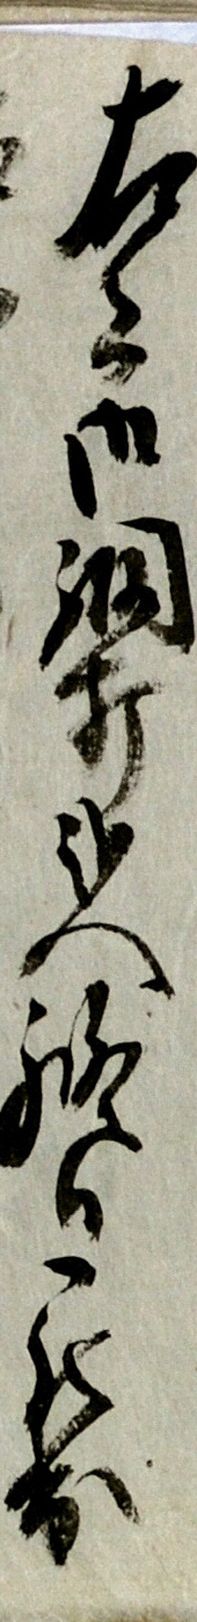右は御網打弐人終日罷出

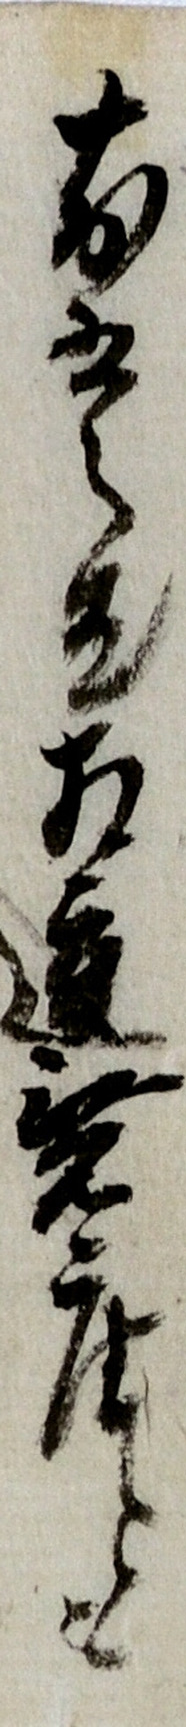前書之通相違無御座候以上
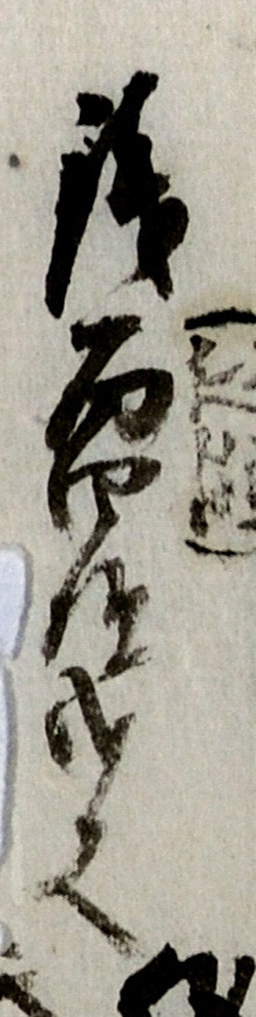銭百四拾弐文
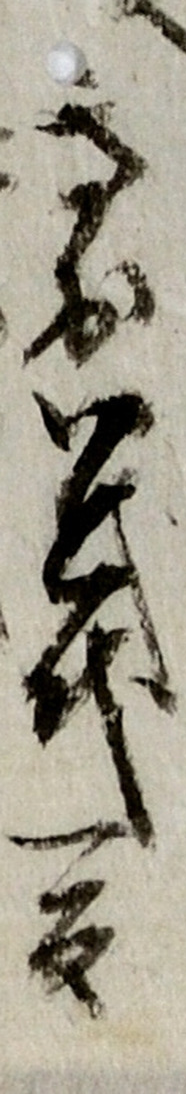きおいと代一反
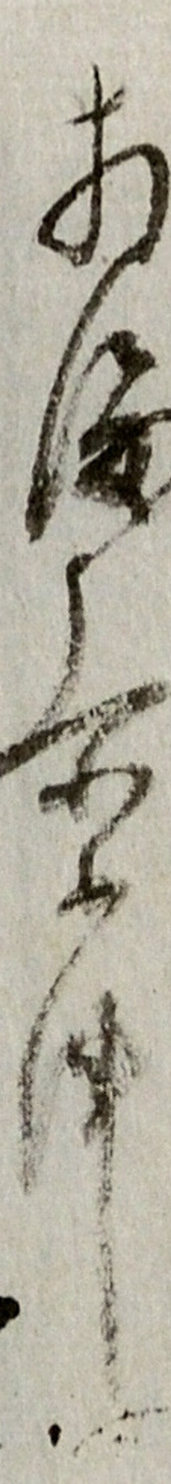相渡申所如件
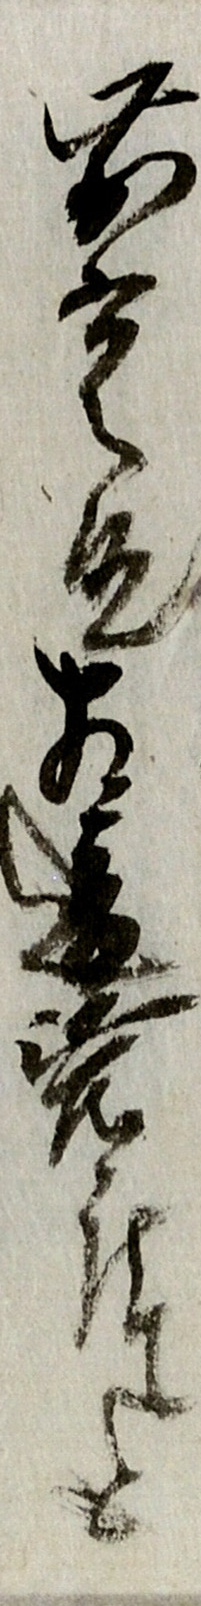前書之通相違御座候以上
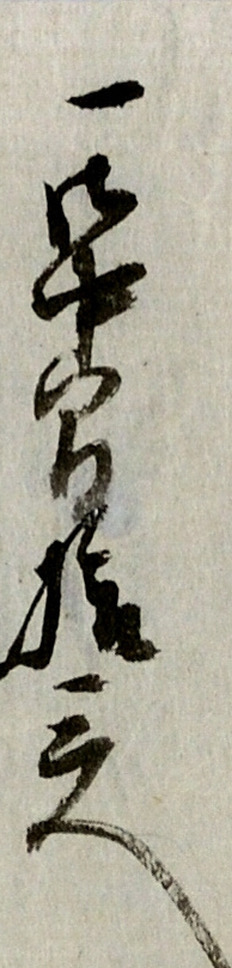一御中間拾三人
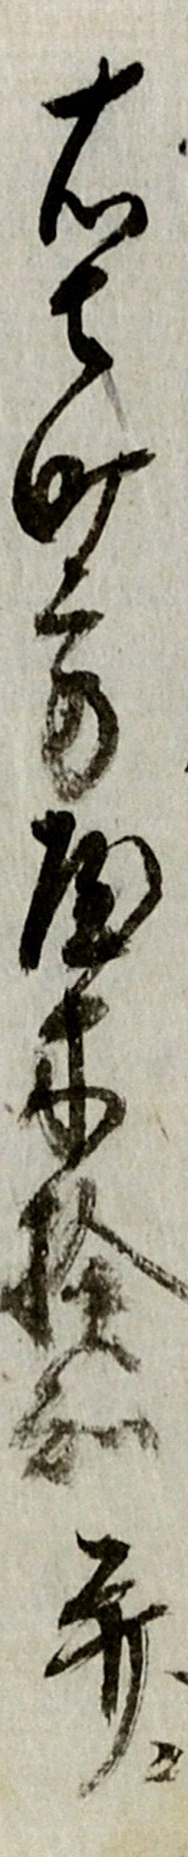右は町方屋木検知并ニ
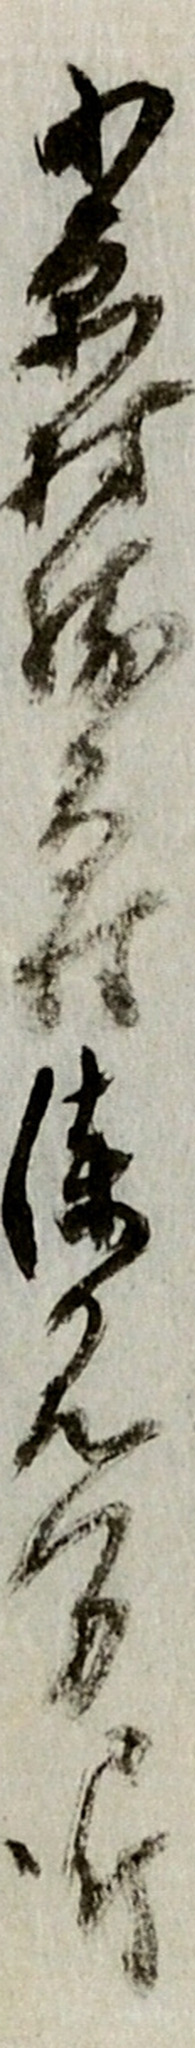小原村勝間村漆見分ニ付
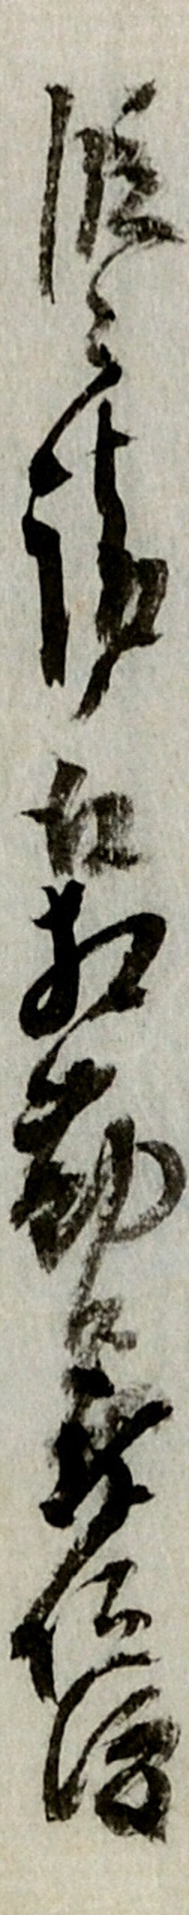段々請取相勤候被仰渡
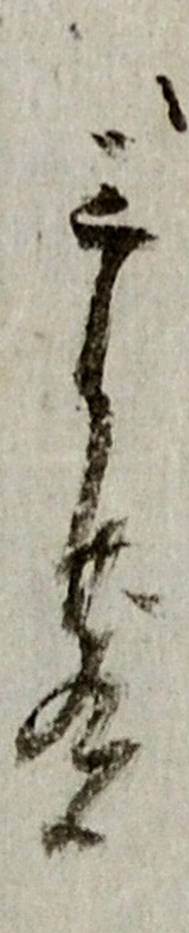三月廿九日
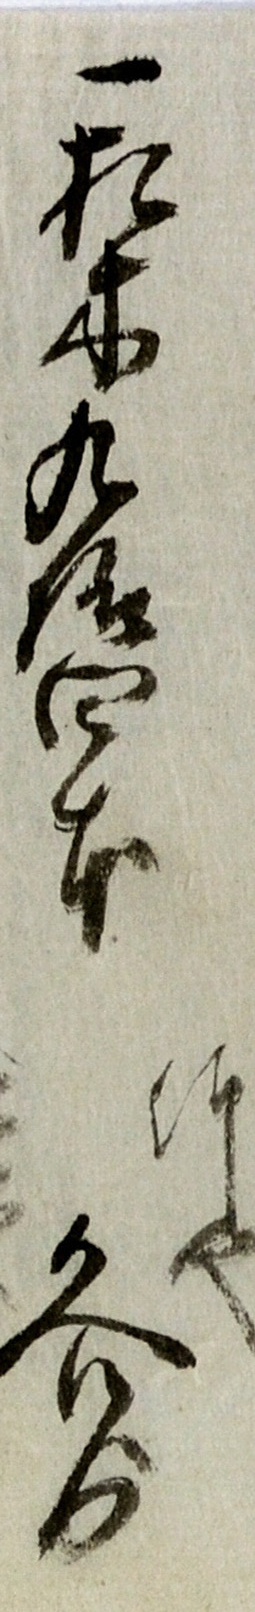一松木九拾四本久左衛門
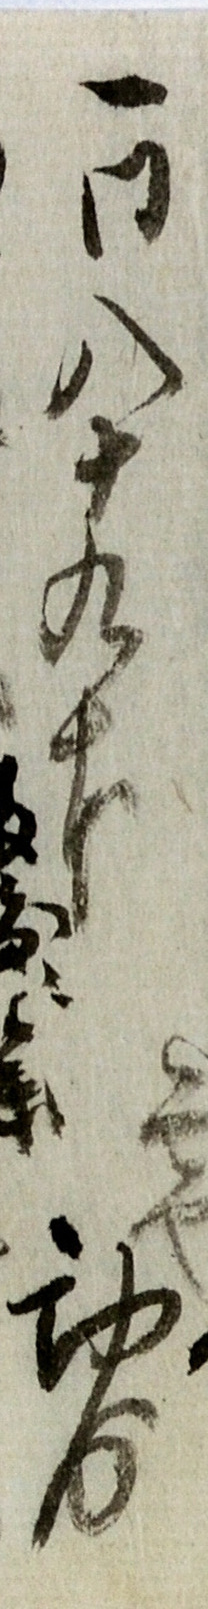一同八十九本勘左衛門
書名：分一方諸事御用留帳
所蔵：伊那市立高遠町図書館・合同会社AMANE
